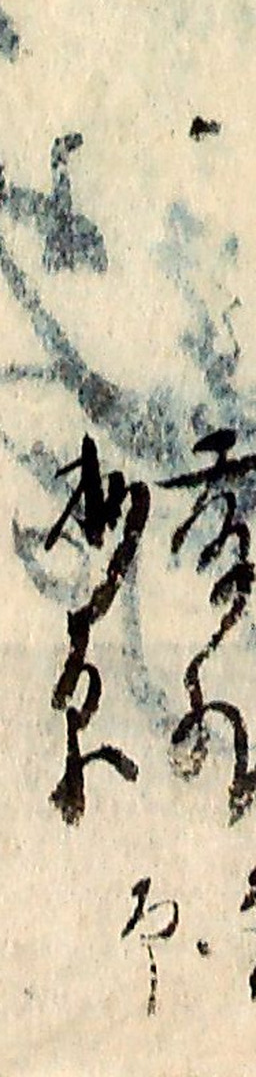利兵衛印
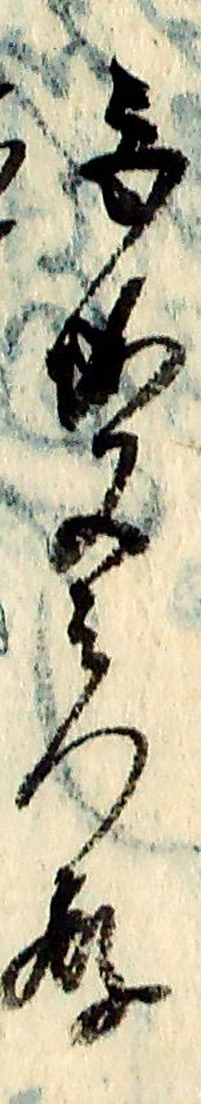宮城文右衛門殿
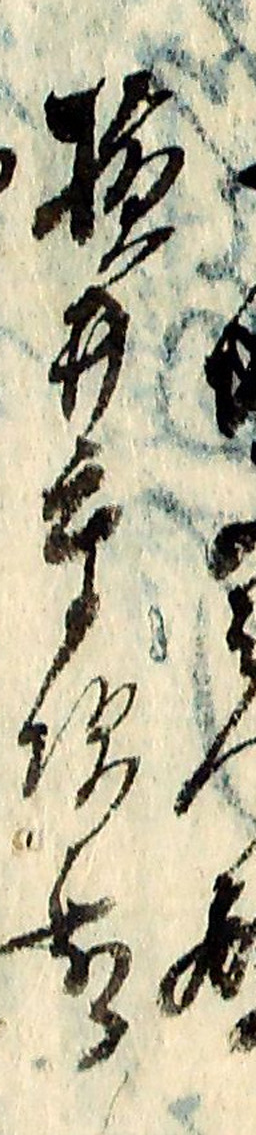横井守次殿
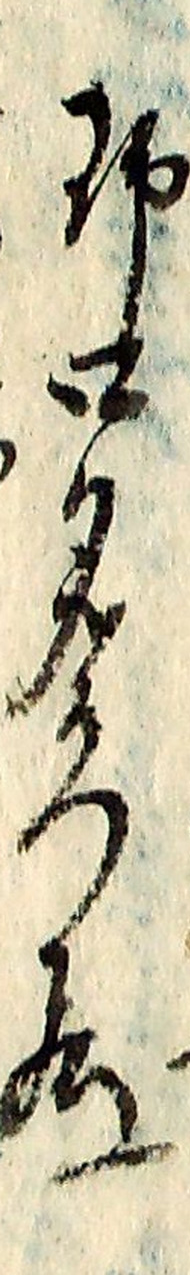野口名左衛門殿
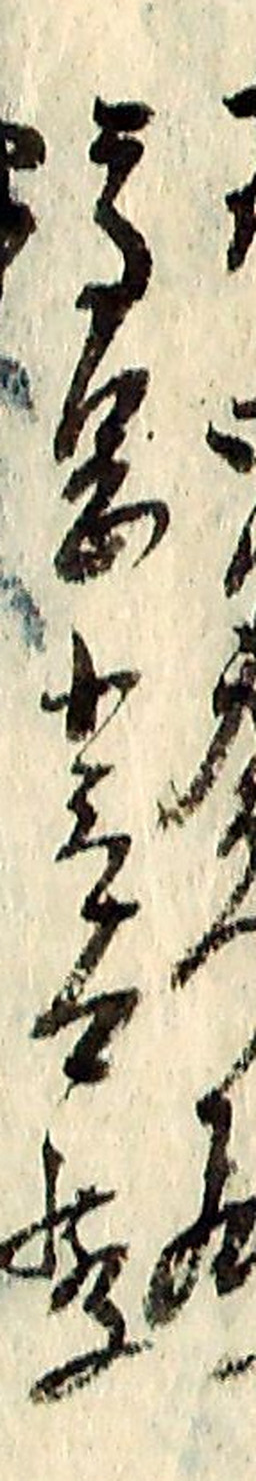高岡小三太殿
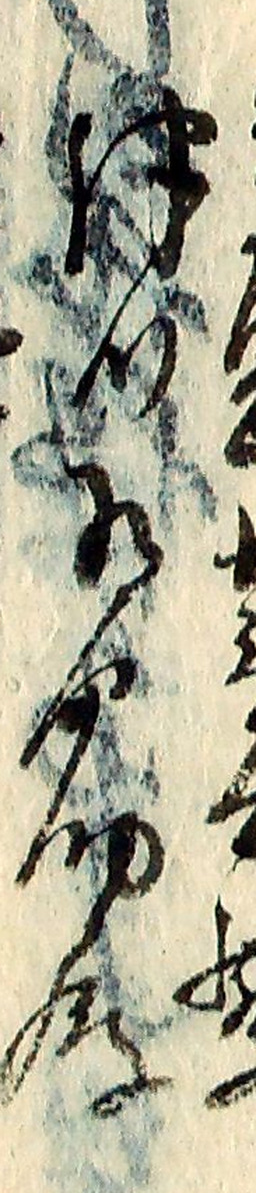津川羽田助殿
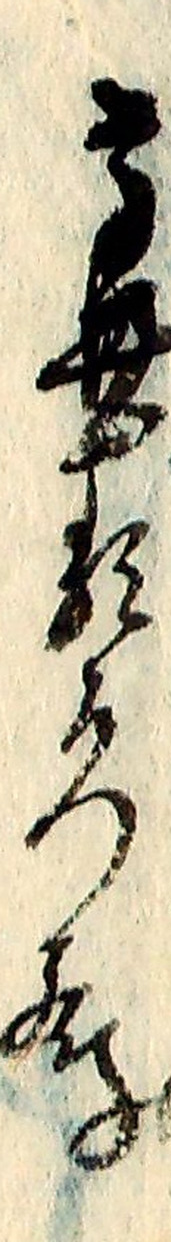高井類左衛門殿
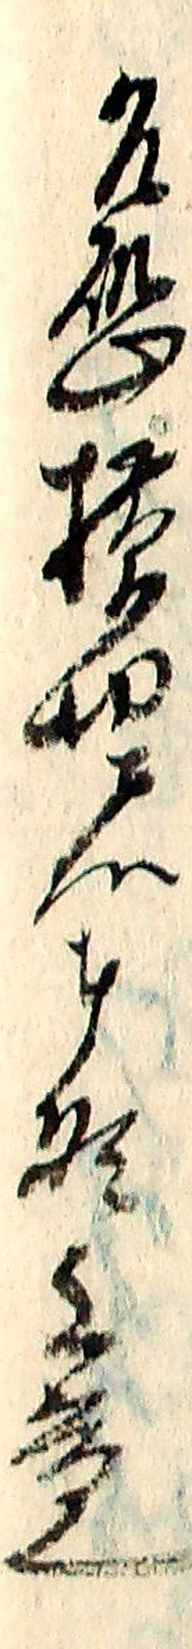乍恐横切を以奉願上覚

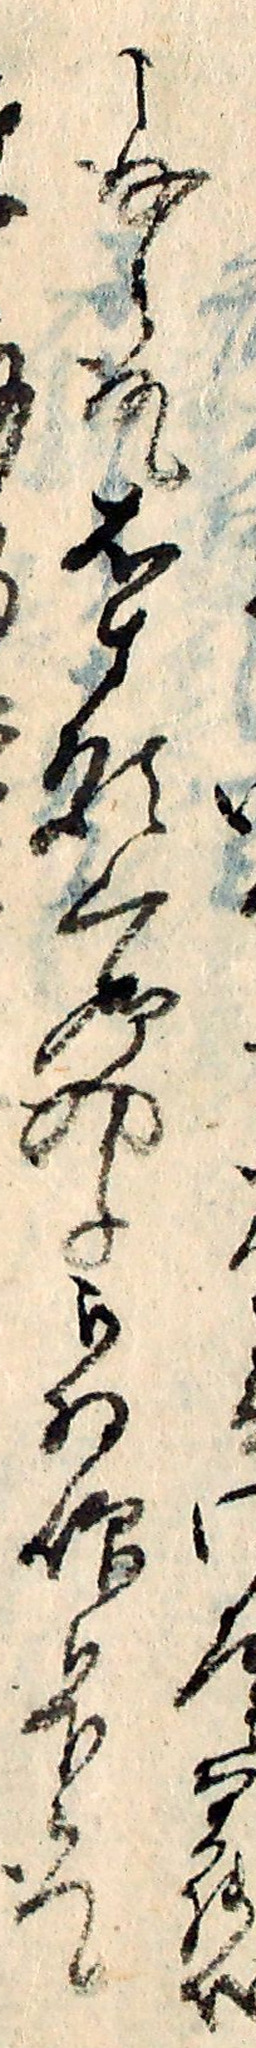申存し存候右奉願上御切手被為仰被下候はゝ
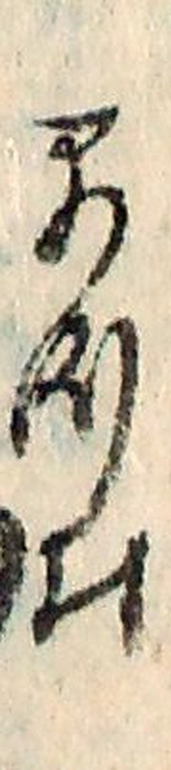早淵村
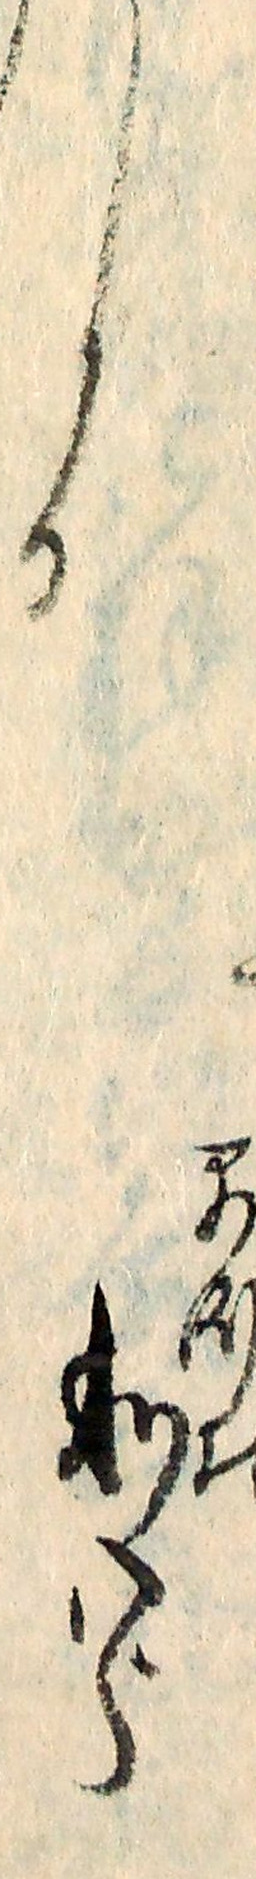利八郎
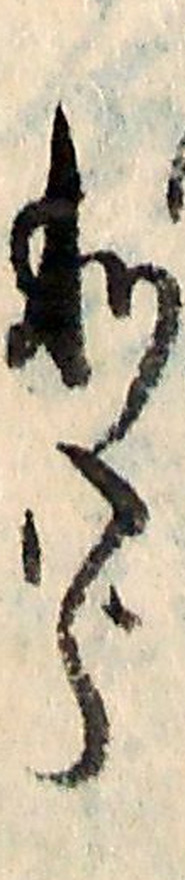利八郎
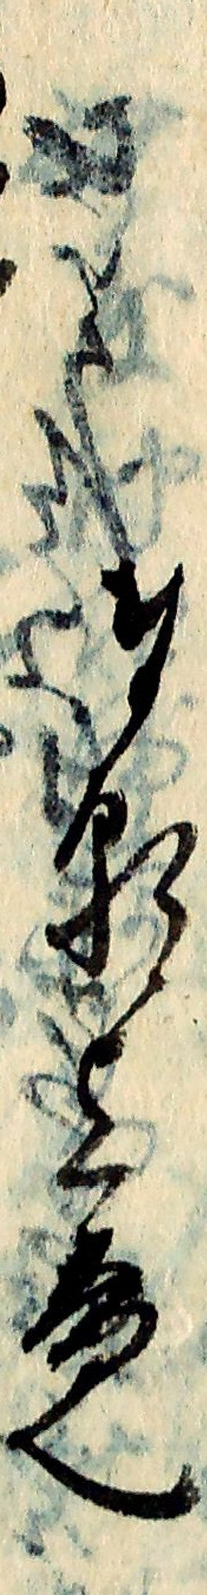奉願上覚
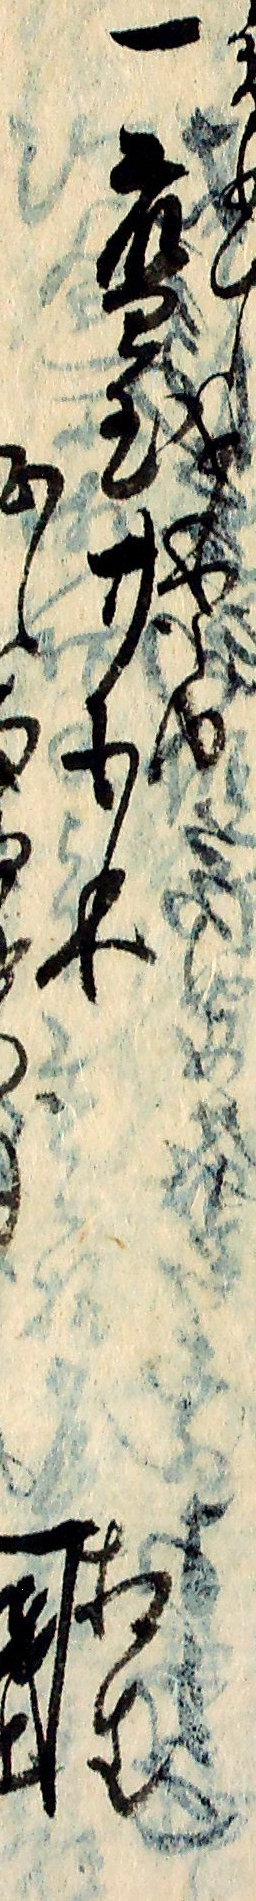一藍玉廿五本相生
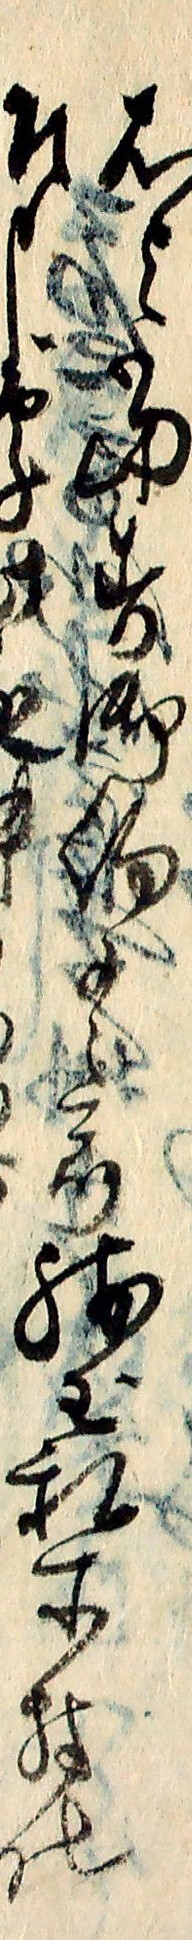右は当春御約め之節残玉私所持仕
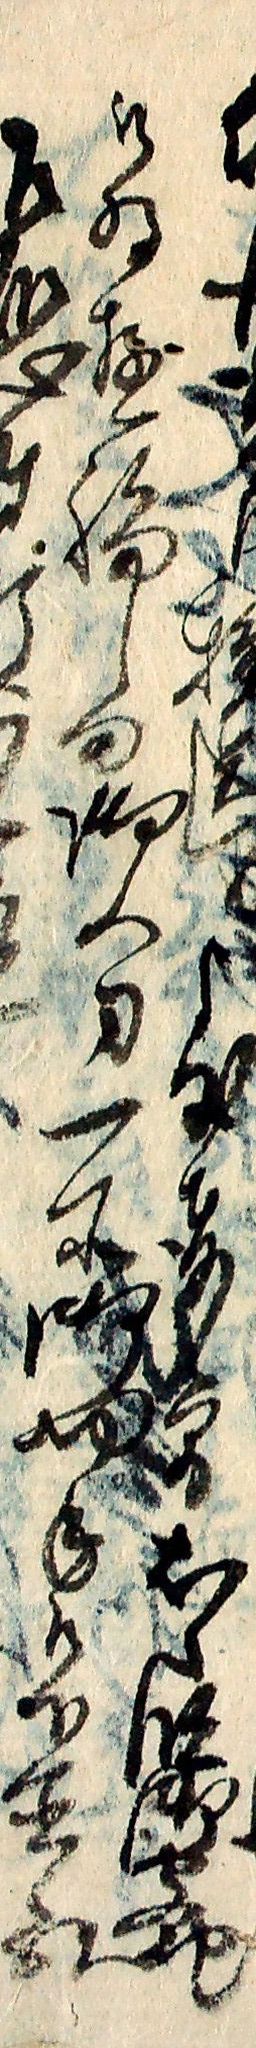被為遊福しま御分一所御切手被下置候様
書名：諸御願書控(後藤氏壱番）
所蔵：鳴門教育大学 Naruto University of Education
